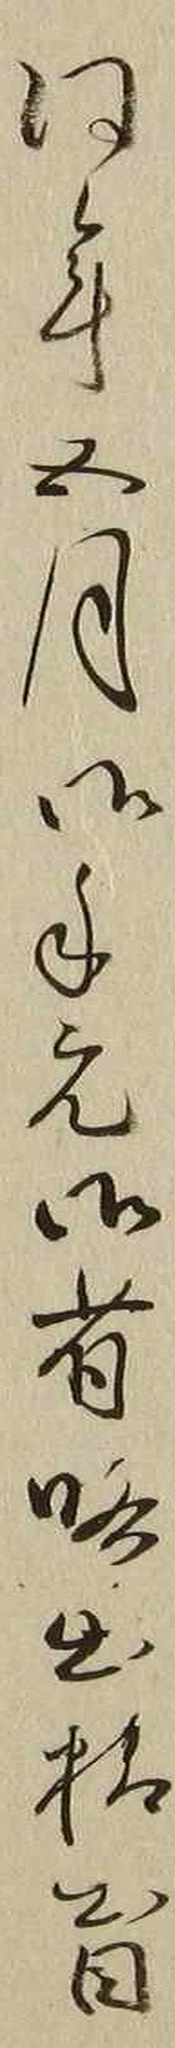一同年五月御手元御省略出精出目
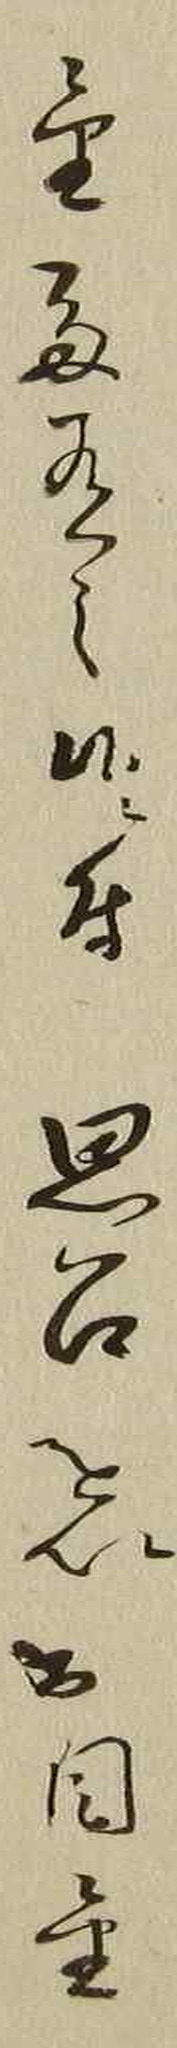金多有之候ニ付思召を以出目金
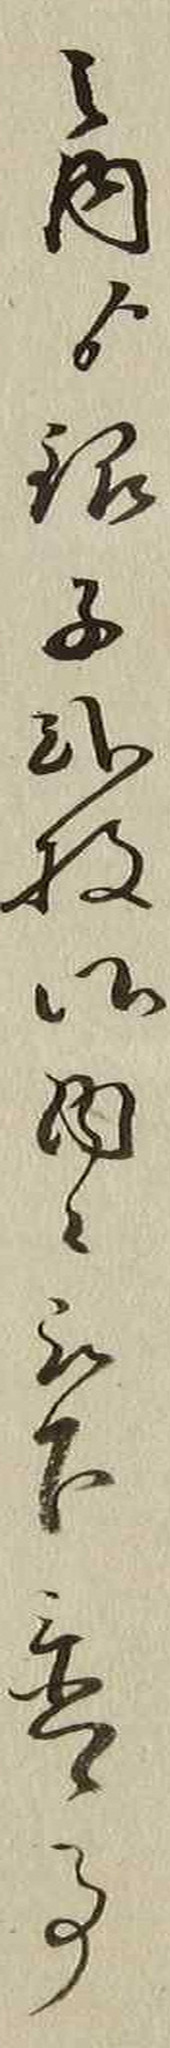之内ゟ銀子弐枚御内々被下置候事
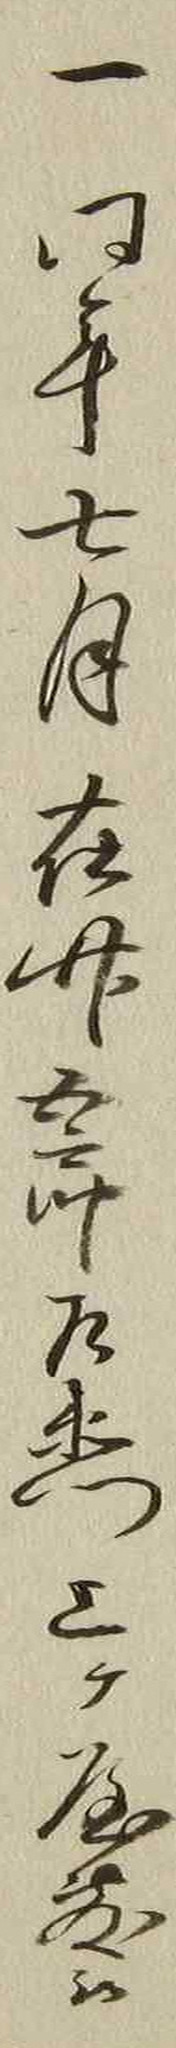一同年七月在竹五郎左衛門上ケ屋敷被
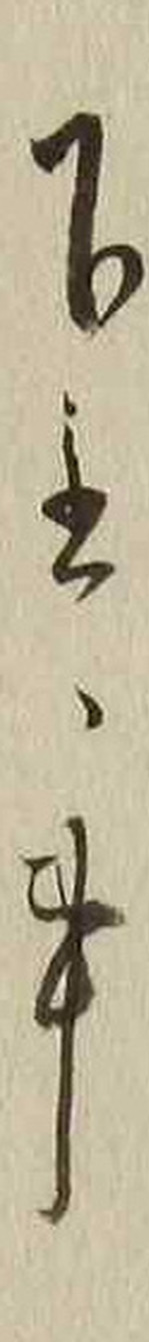下置候事
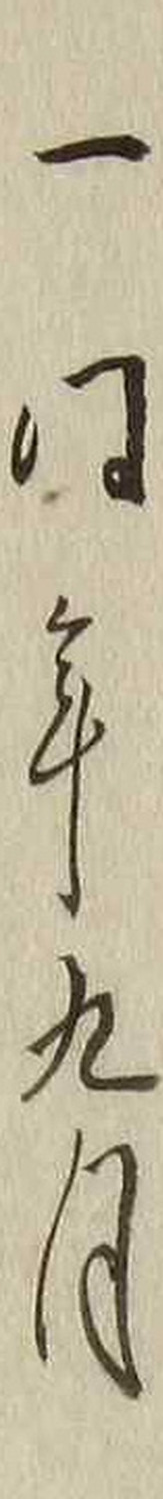一同年九月
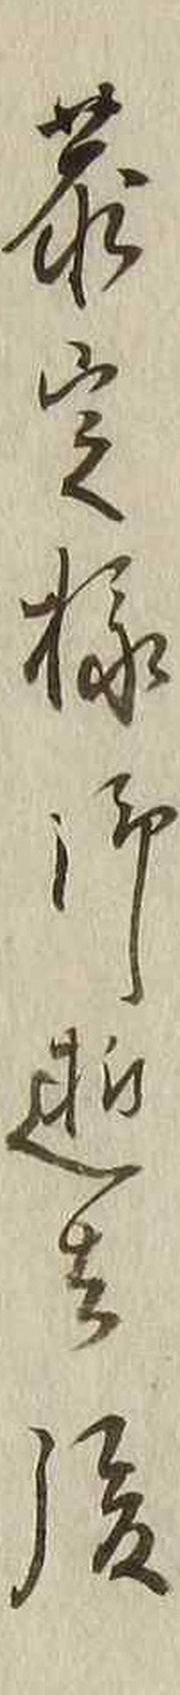恭定様御逝去後
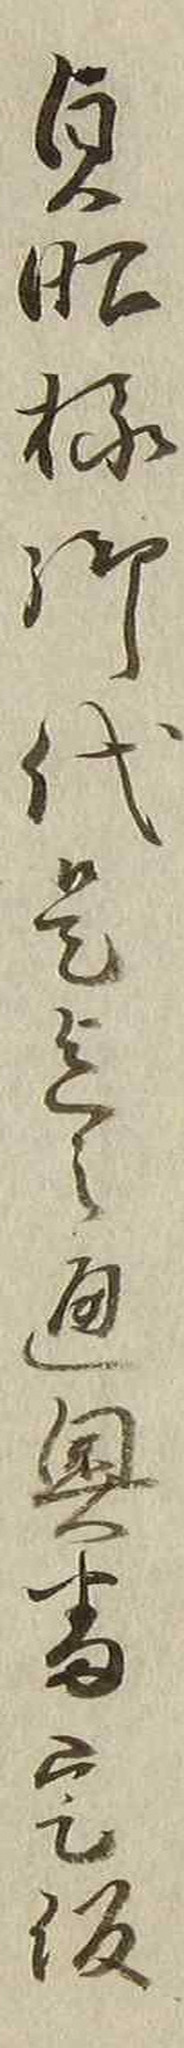貞昭様御代是迄之通奥番定仮
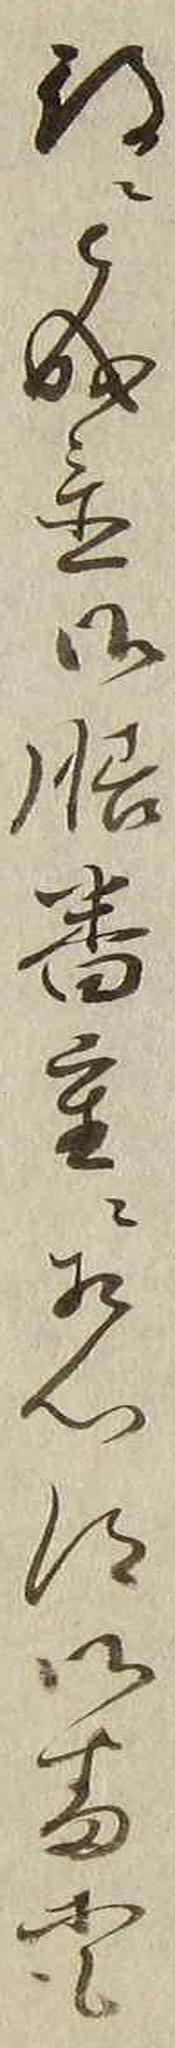役ニ被成置御膳番重に相心得御番等も
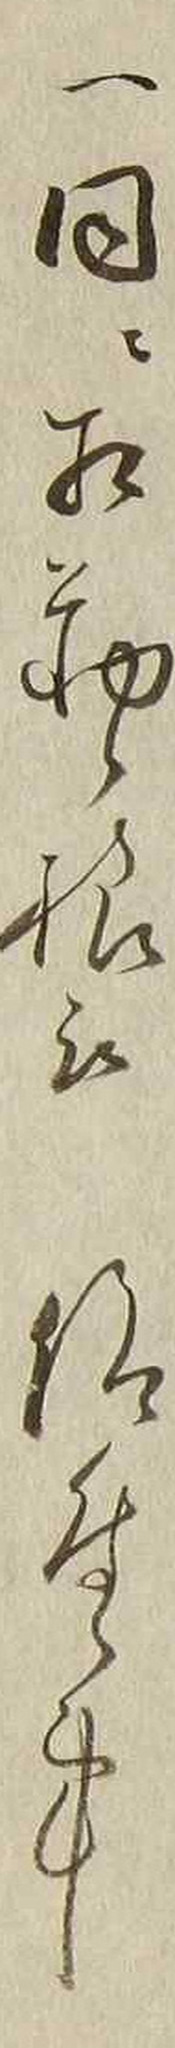一同ニ相勤候様被仰付候事
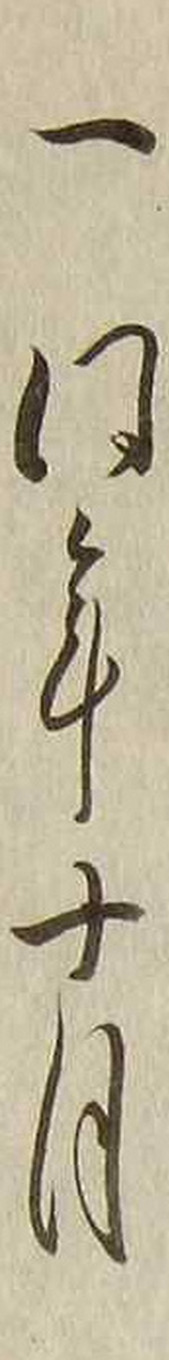一同年十月
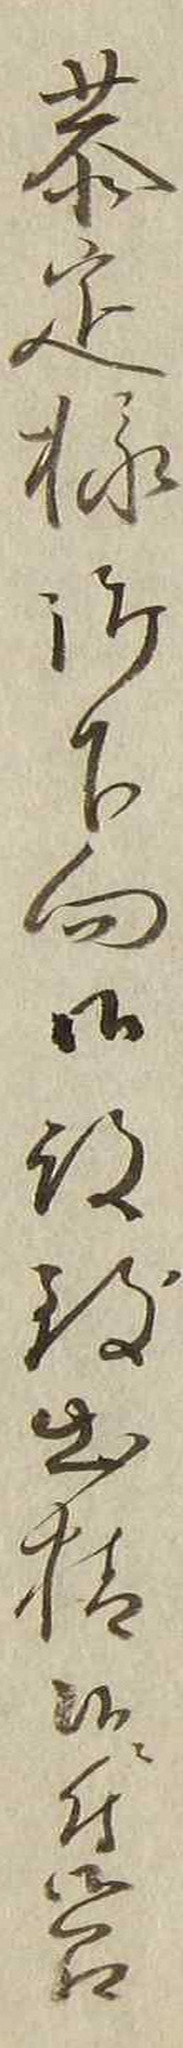恭定様御下向御役致出精候ニ付御召

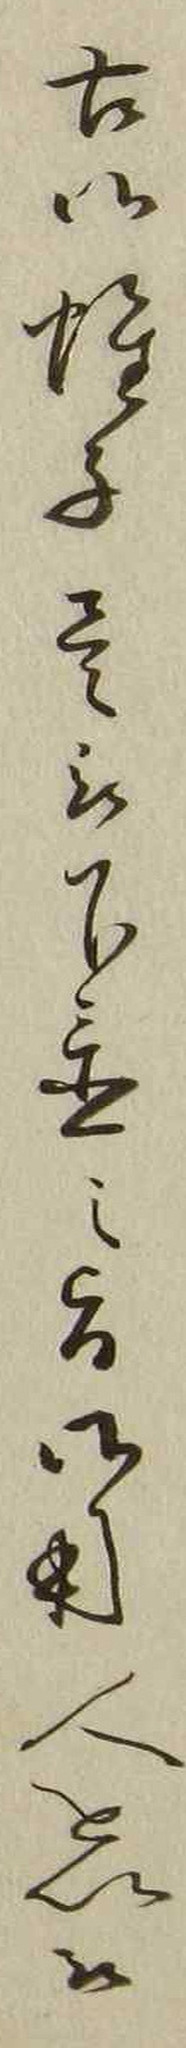古御帷子壱被下置之旨御用人を以被
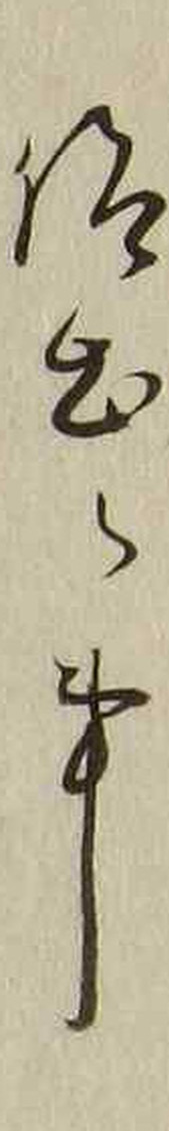仰出候事
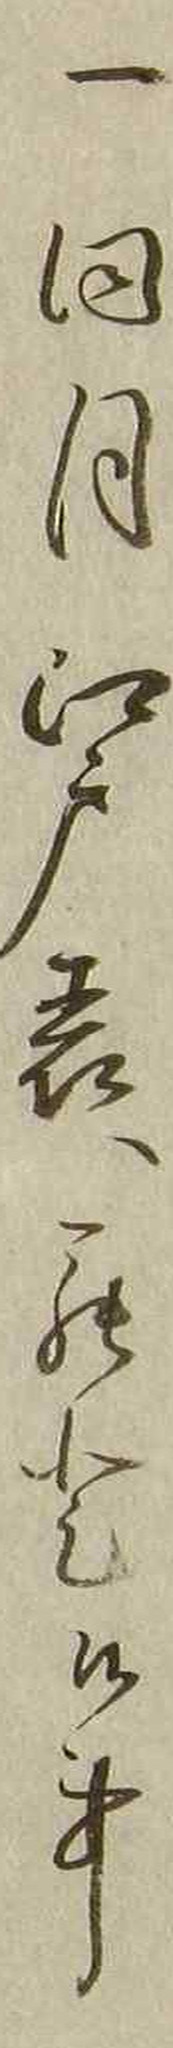一同月江戸表へ罷登候事
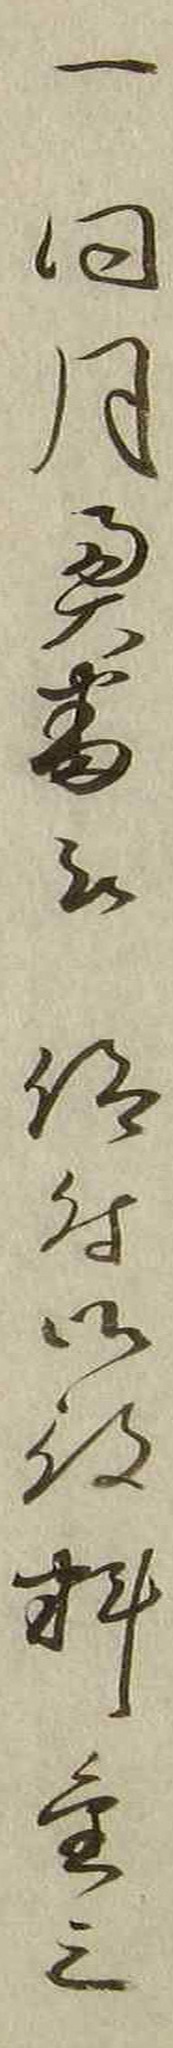一同月奥番被仰付御役料金三
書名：諸士系譜　巻之25　い之部25
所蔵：会津若松市立会津図書館
